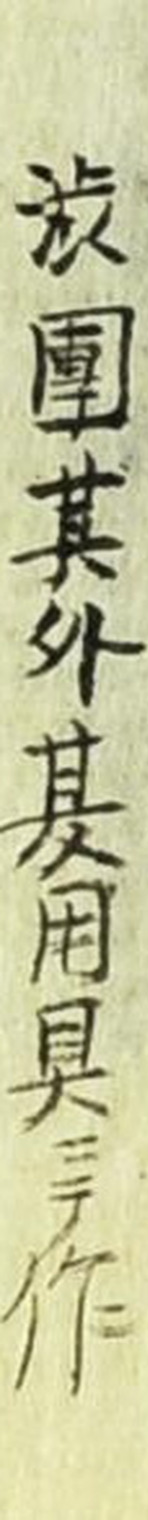渋団其外夏用具ニテ作
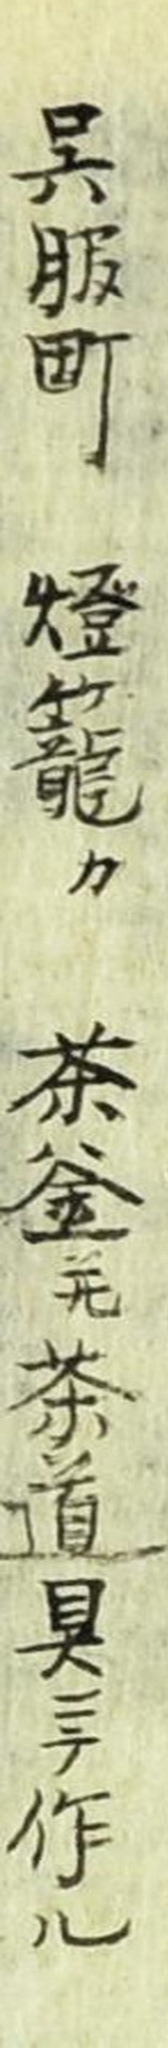呉服町燈籠ヵ茶釜幷茶道具ニテ作ル
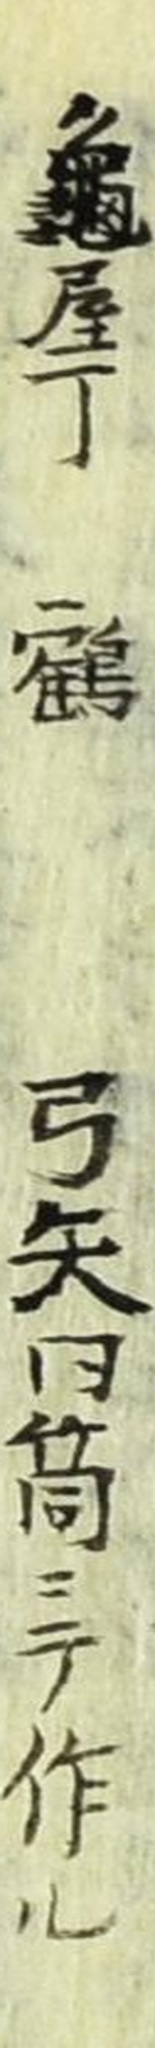亀屋丁鶴弓矢同筒ニテ作ル
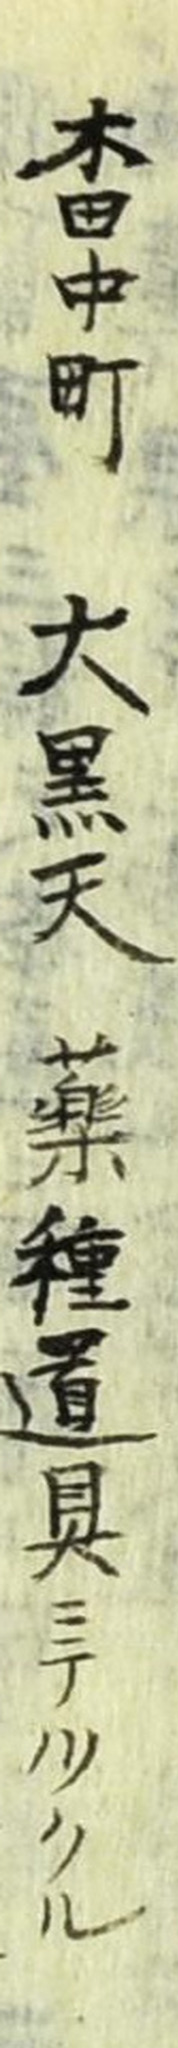木田中町大黒天薬種道具ニテツクル
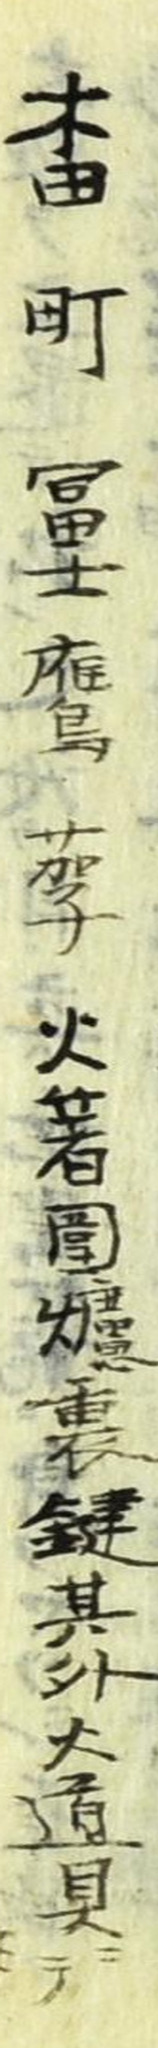木田町富士鷹茄子火箸囲炉裏鍵其外火道具ニテ作
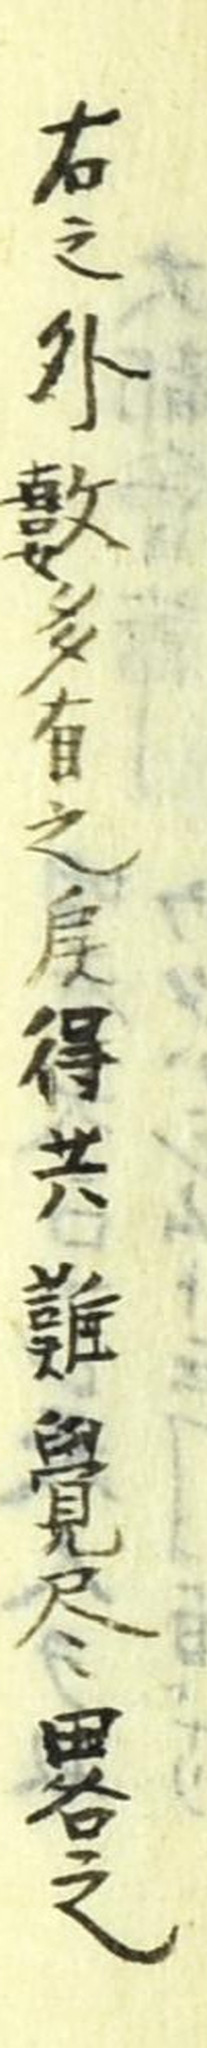右之外数多有之候得共難覚尽略之

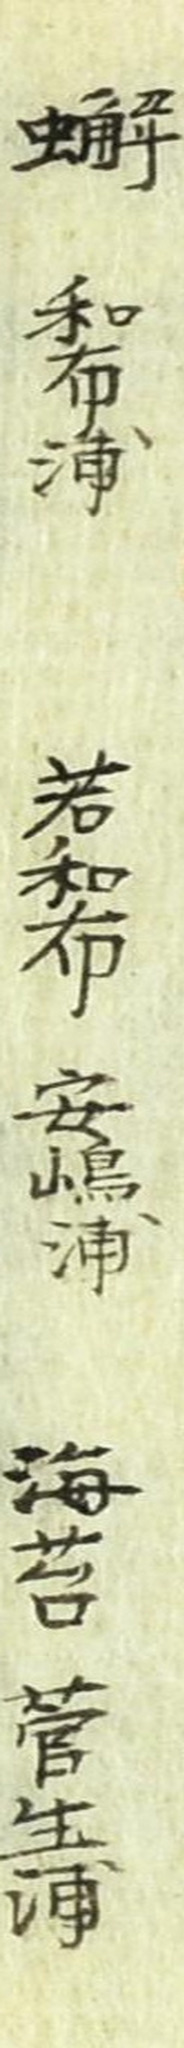蟹和布浦若和布安島浦海苔菅生浦
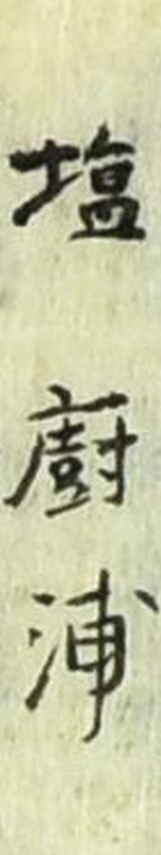塩廚浦

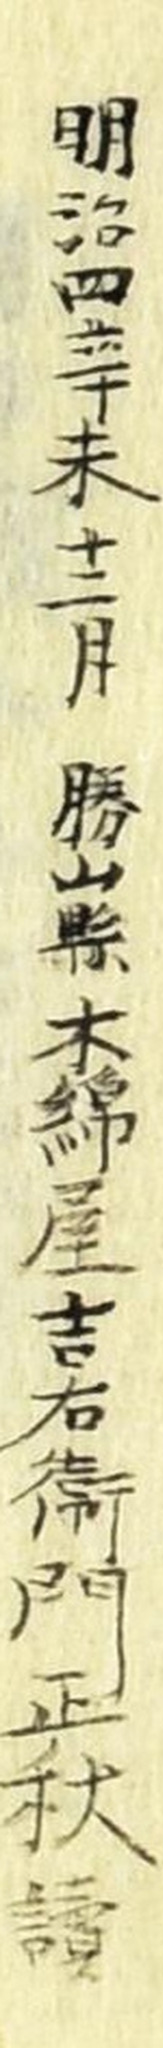明治四辛未十二月勝山県木綿屋吉右衛門正秋読
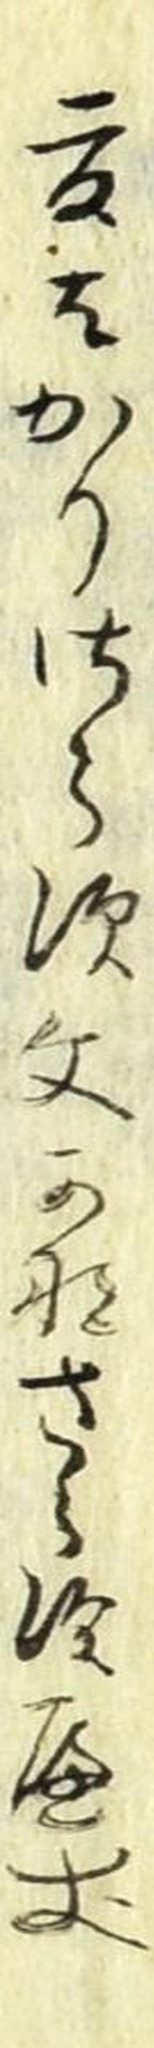夏はかりさらす文かなさらすへき
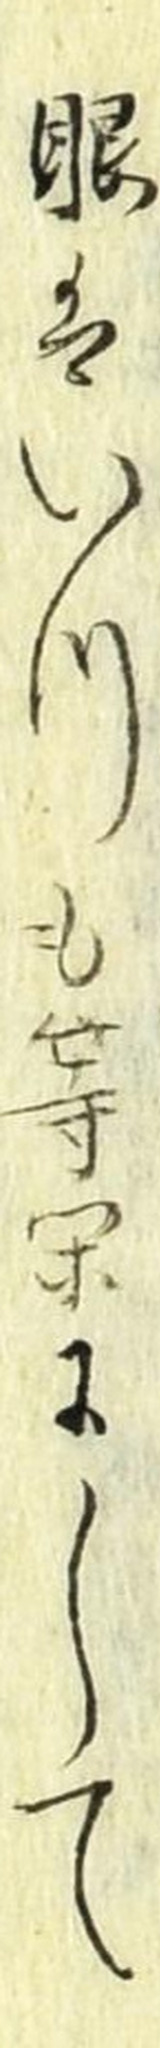眼はいつも等閑にして
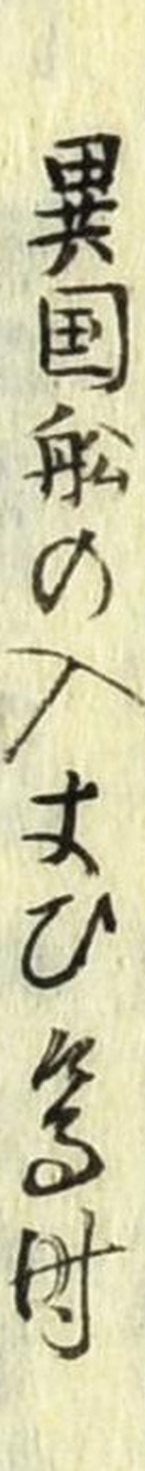異国船の入まひける時
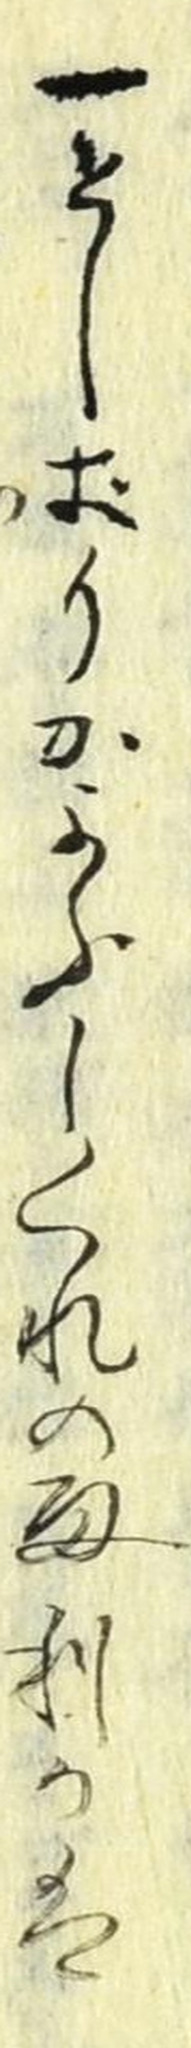一としきりかよふしくれの雨りかは
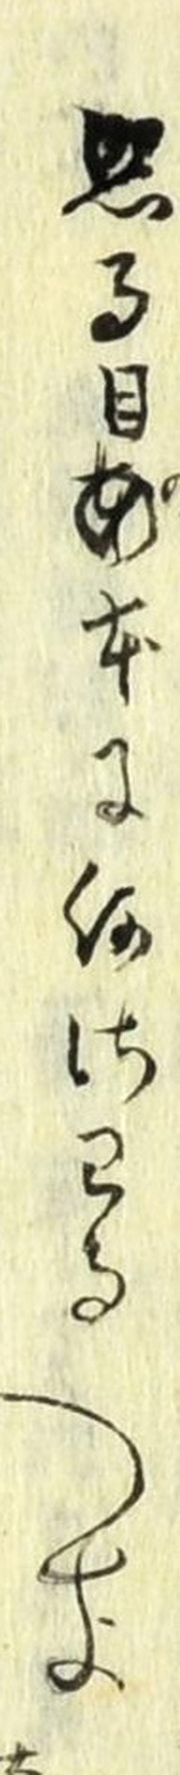照る日の本に何さわるへき
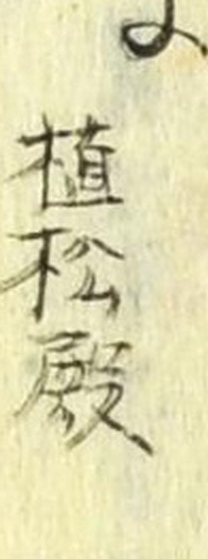植松殿
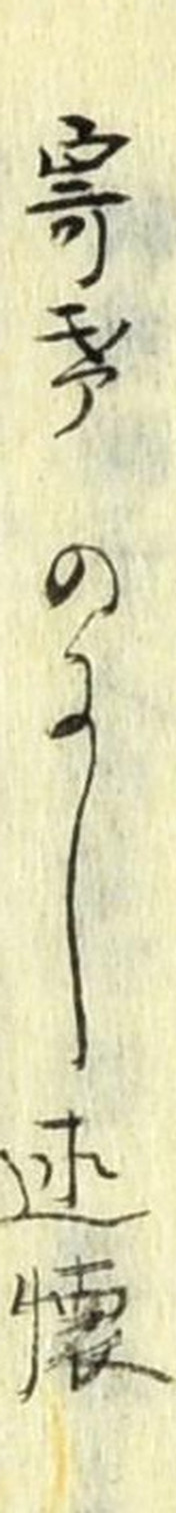寄けのにし述懐
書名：（日記）
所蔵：福井県文書館 Fukui Prefectural Archives
